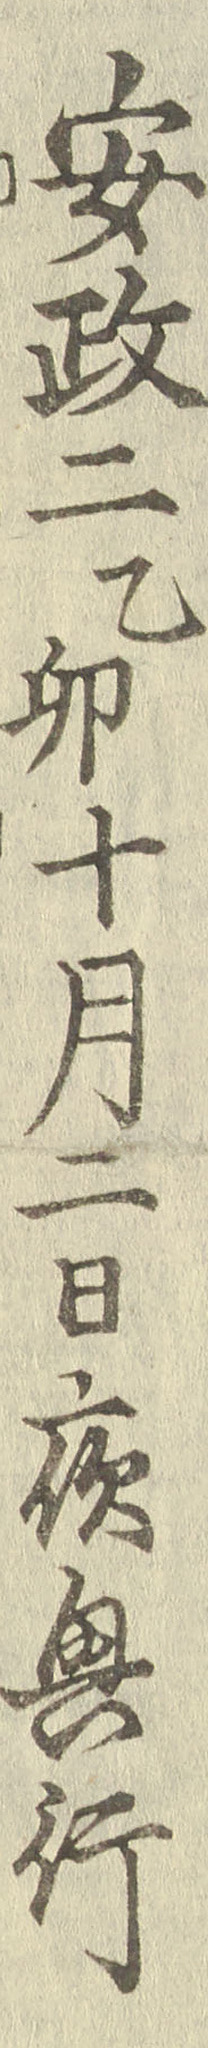安政二乙卯十月二日夜興行
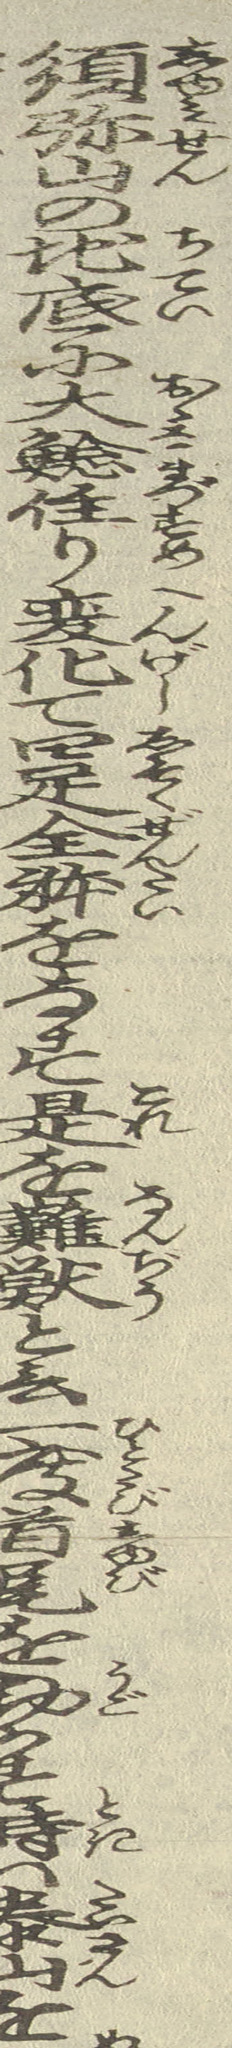須弥山の地底に大鯰住り変化て四足全躰をなす是を難獣と云一度首尾を動かす時は泰山を抜
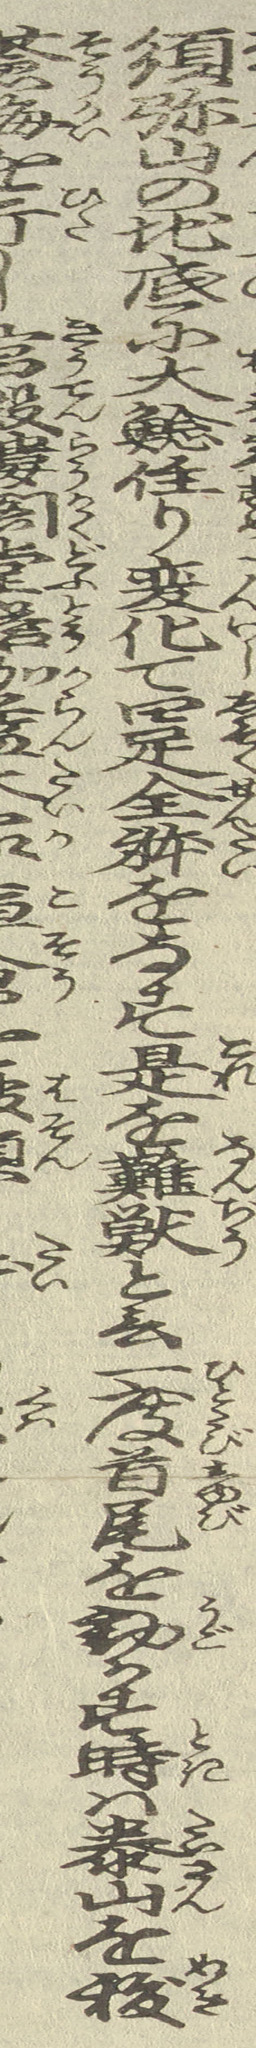須弥山の地底に大鯰住り変化て四足全躰をなす是を難獣と云一度首尾を動かす時は泰山を抜
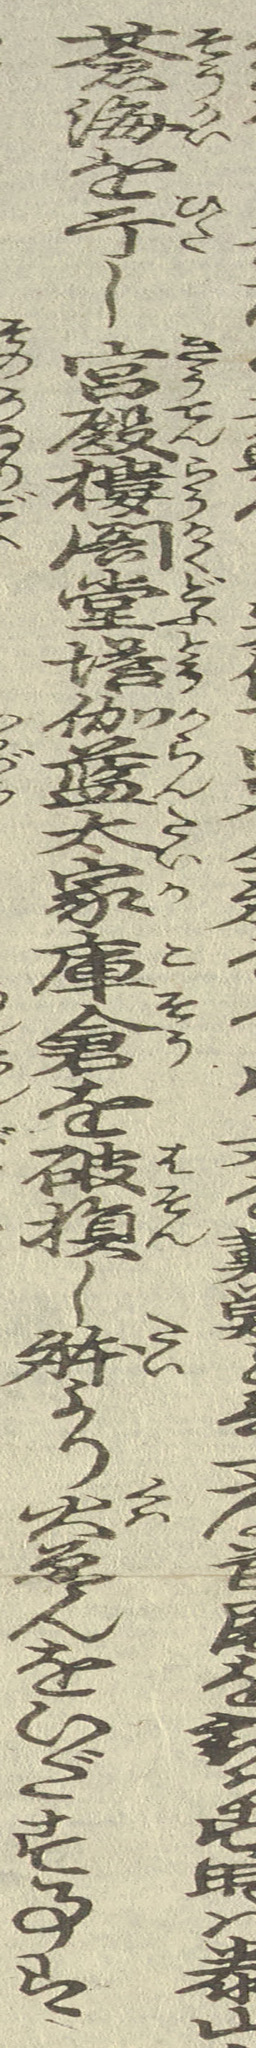蒼海を干し宮殿樓閣堂塔伽藍太家庫倉を破損し躰より火ゑんをいだす事いと
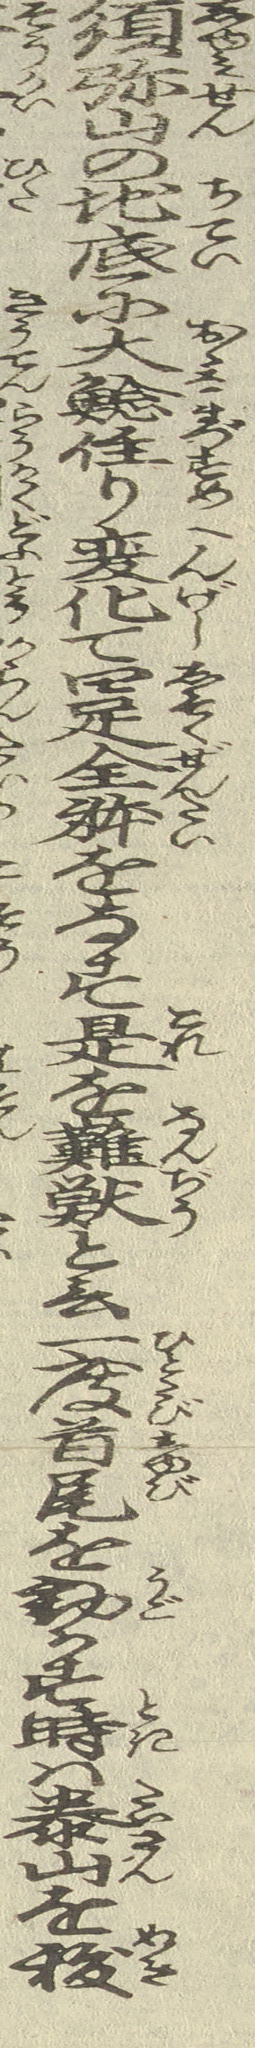須弥山の地底に大鯰住り変化て四足全躰をなす是を難獣と云一度首尾を動かす時は泰山を抜
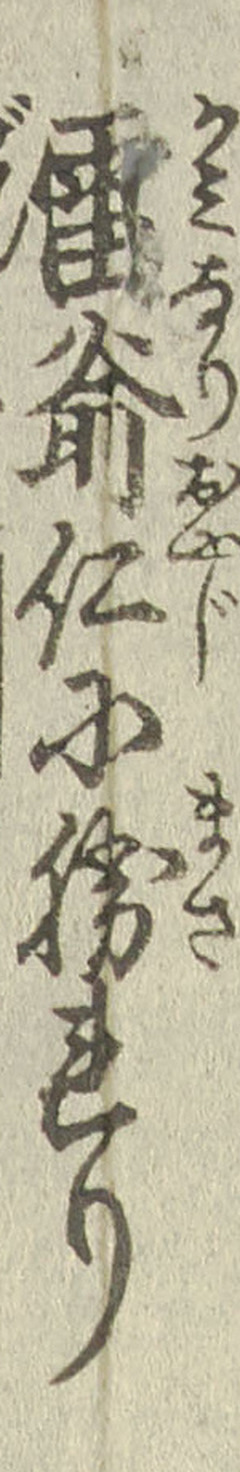雷爺仁に勝れり
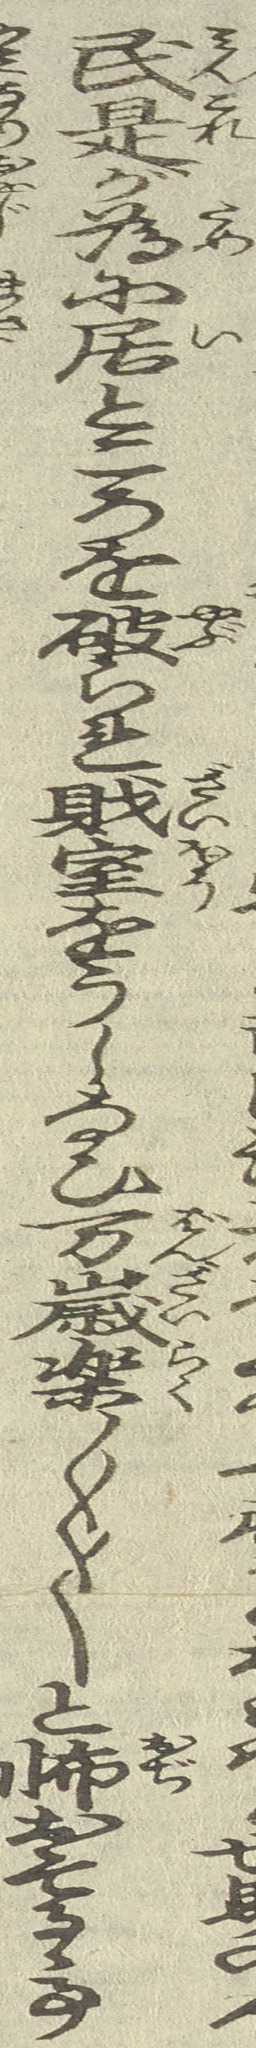民是が為に居ところを破られ財宝をうしなひ万歳楽〳〵〳〵〳〵と怖おそるる事
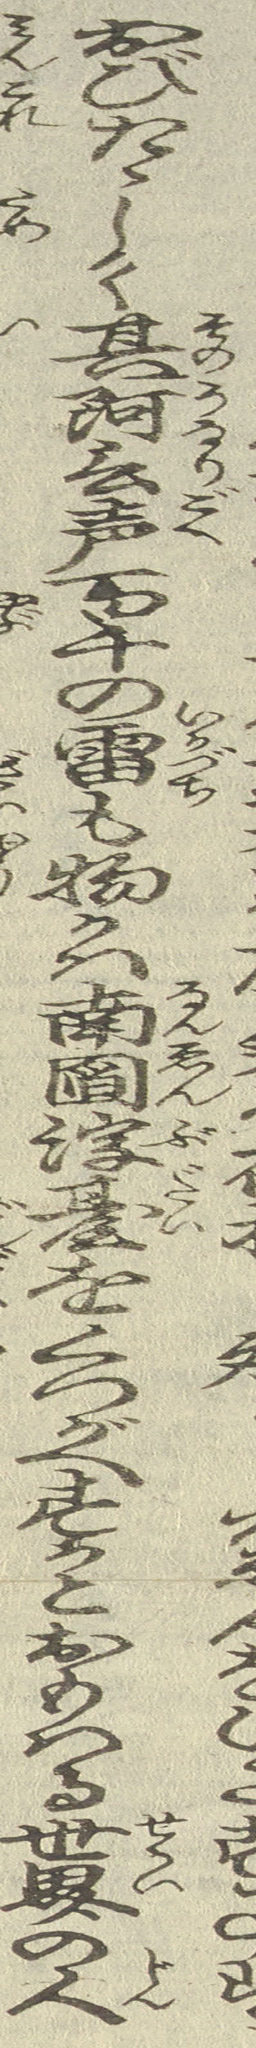おびたゝしく其阿云声百千の雷も物かは南圓浮臺をくつがへすかとおもはる世界の人
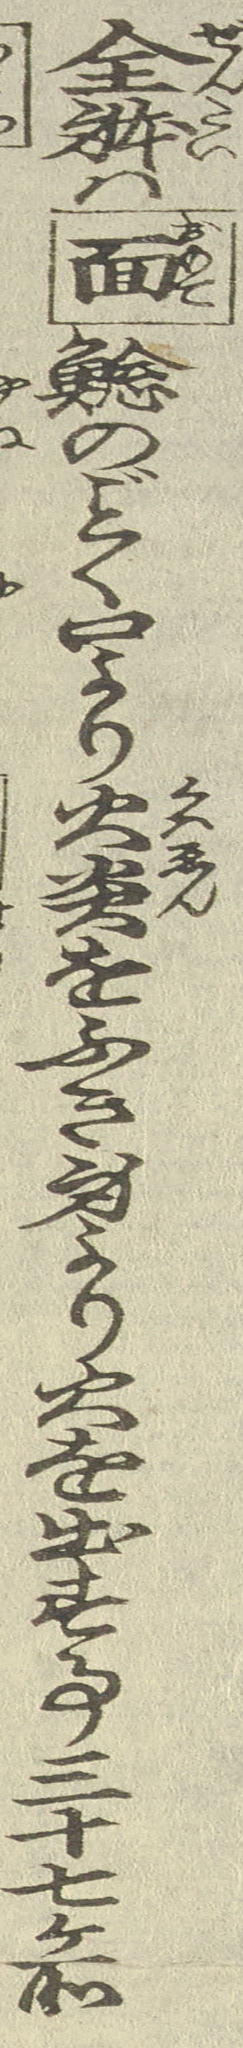全躰は「面」鯰のごとく口より火炎をふき身より火を出す事三十七ケ所
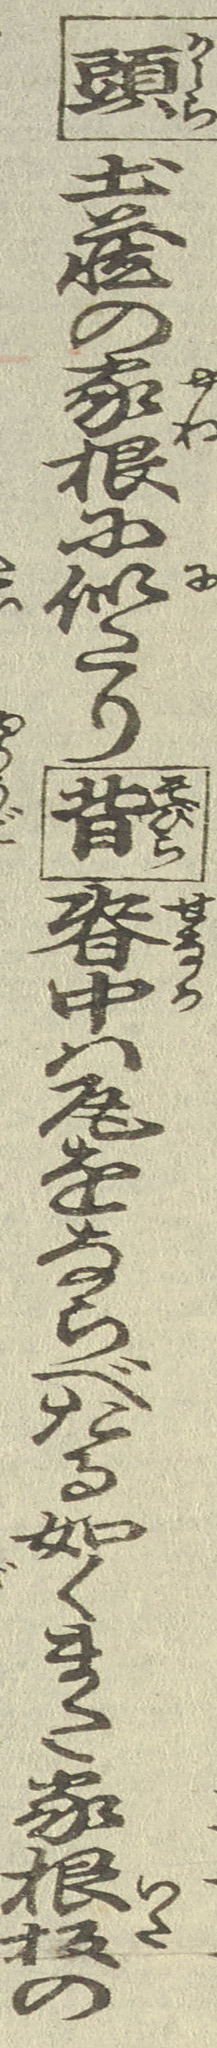「頭」土蔵の家根に似たり「背」背中は瓦をならべたる如くまた家根板の
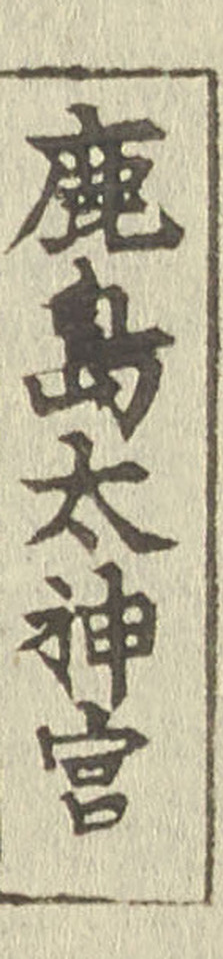鹿島太神宮
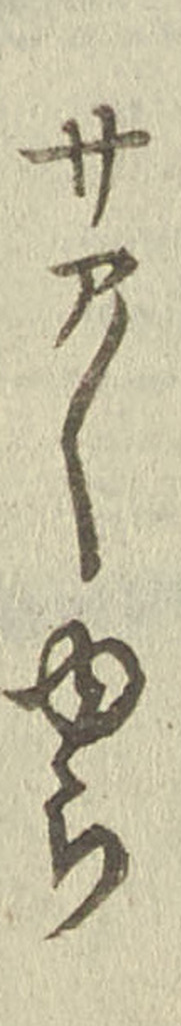サア〳〵ゆら
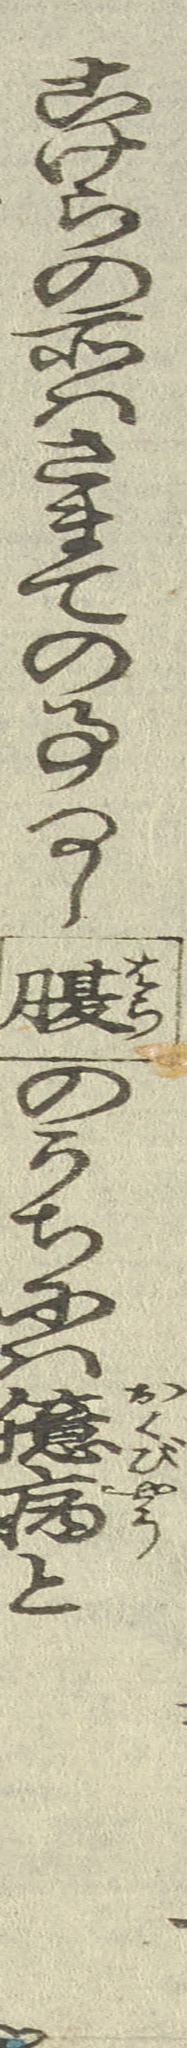こけらの所はさまての事なし「腹」のうちには臆病と
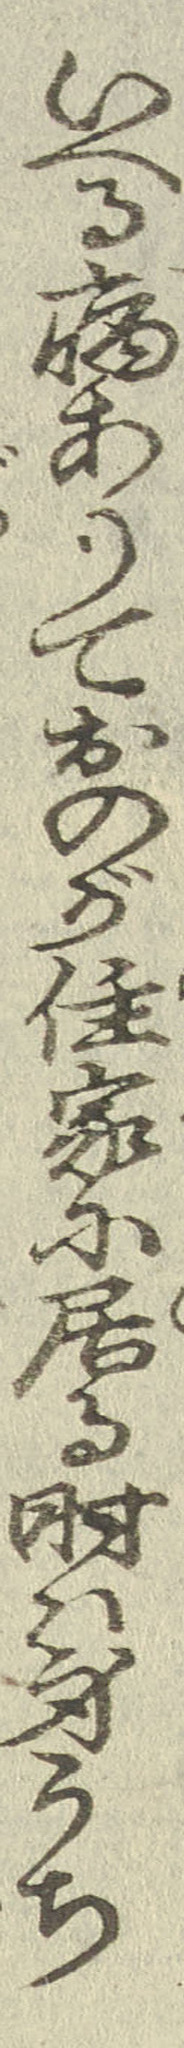いへる病ありておのが住家に居る時は身うち
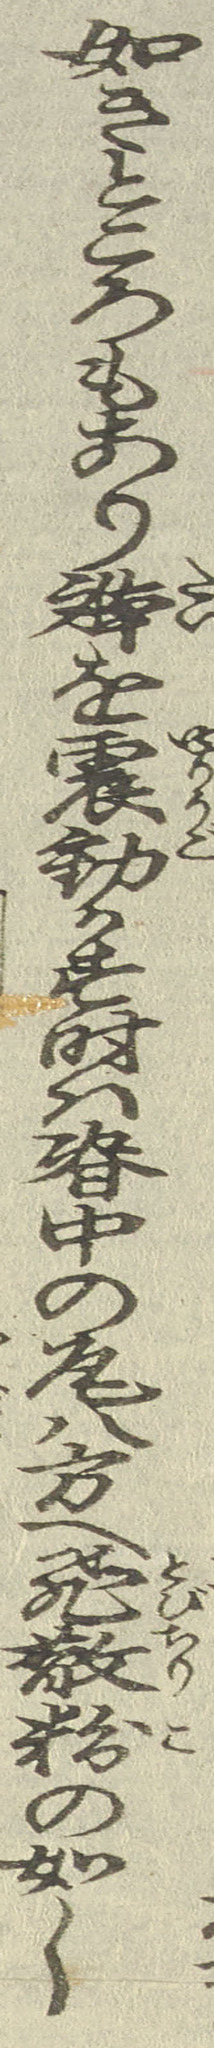如きところもあり躰を震動かす時は背中の瓦八方へ飛散粉の如く
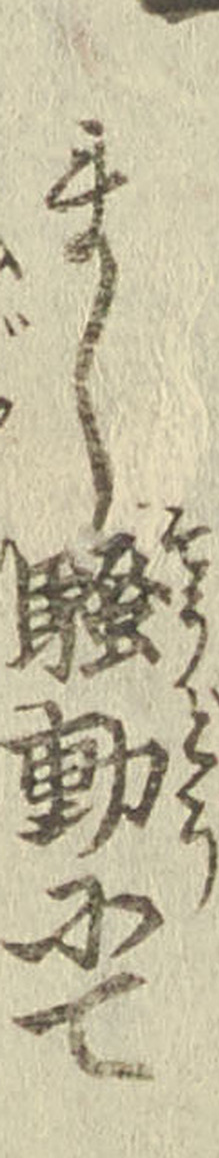まし騒動にて
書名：上方震下り瓢磐鯰の化物 一名難獣といふ
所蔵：東京大学総合図書館 General Library in the University of Tokyo, JAPAN
